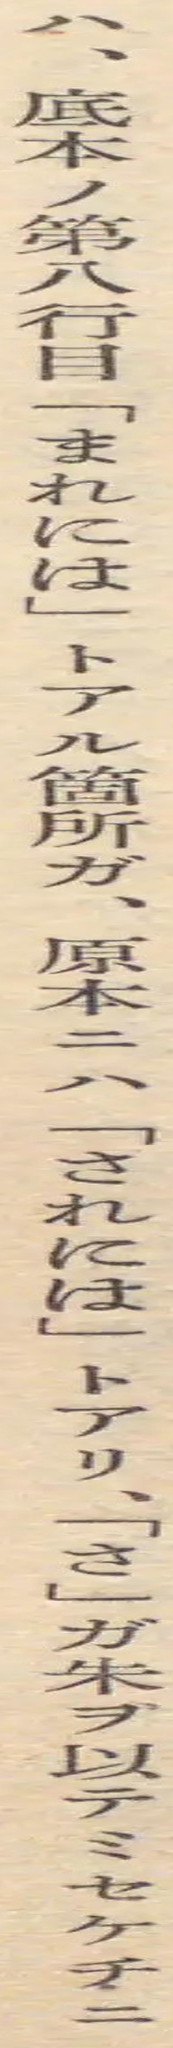ハ、底本ノ第八行目「まれには」トアル箇所ガ、原本ニハ「されには」トアリ、「さ」ガ朱ヲ以テミセケチニ
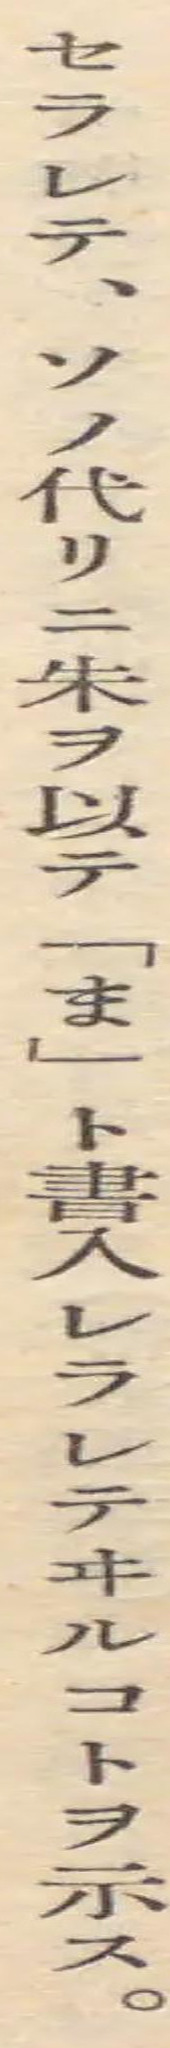セラレテ、ソノ代リニ朱ヲ以テ「ま」ト書入レラレテヰルコトヲ示ス。
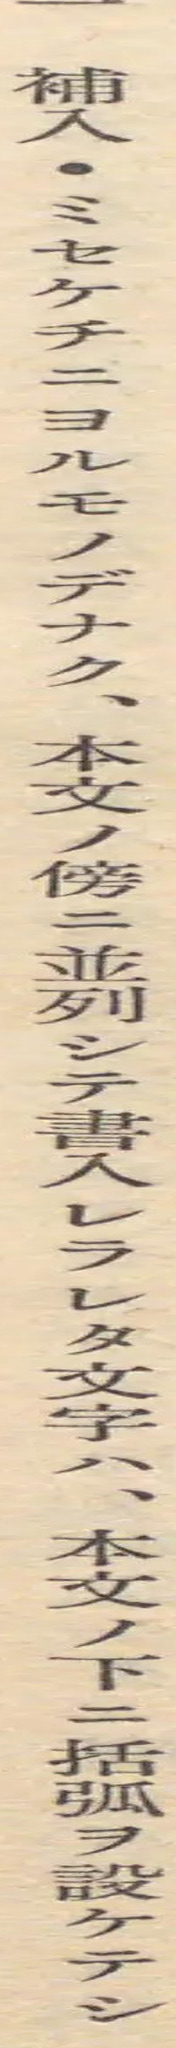一補入・ミセケチニヨルモノデナク、本文ノ傍ニ並列シテ書入レラレタ文字ハ、本文ノ下ニ括弧ヲ設ケテシ
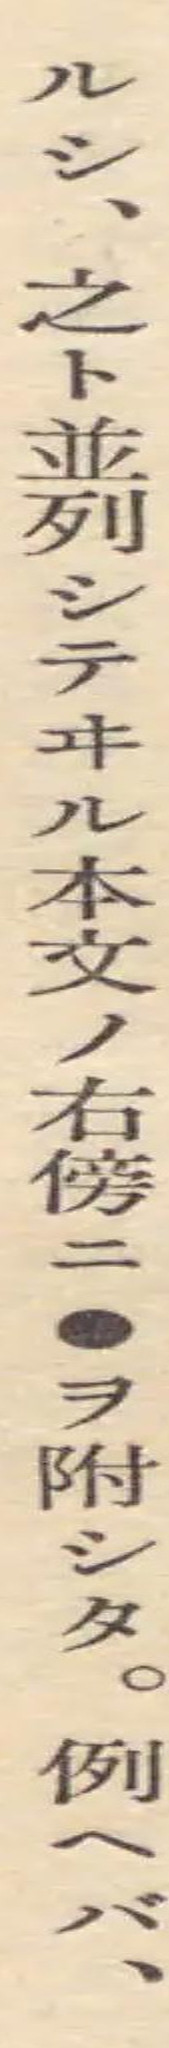ルシ、之ト並列シテヰル本文ノ右傍ニ●ヲ附シタ。例ヘバ、
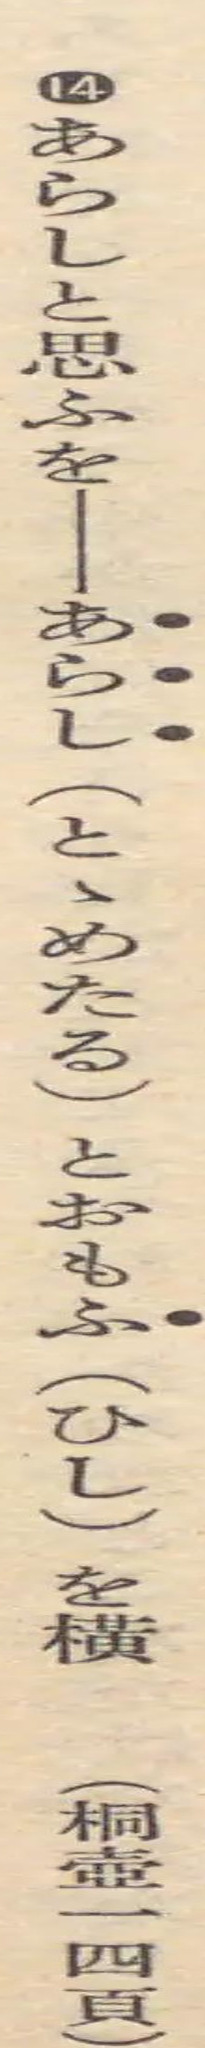⓮あらしと思ふを──あらし(とゝめたる)とおもふ(ひし))を横(桐壺一四頁)
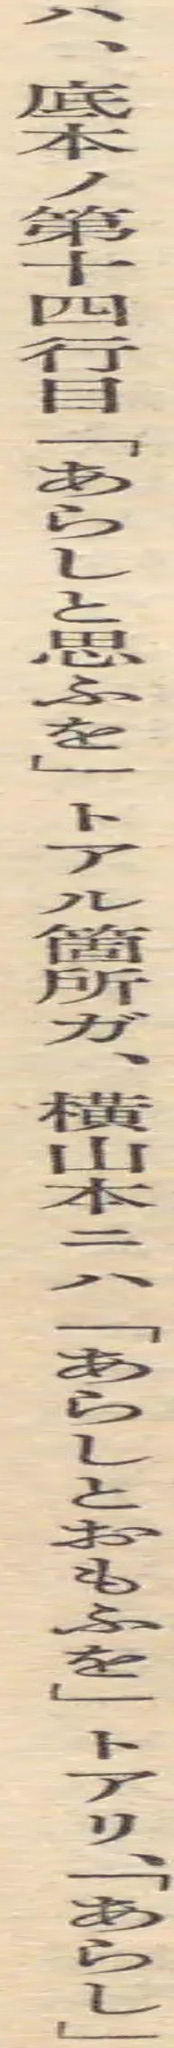ハ、底本ノ第十四行目「あらしと思ふを」トアル箇所ガ、横山本ニハ「あらしとおもふを」トアリ、「あらし」
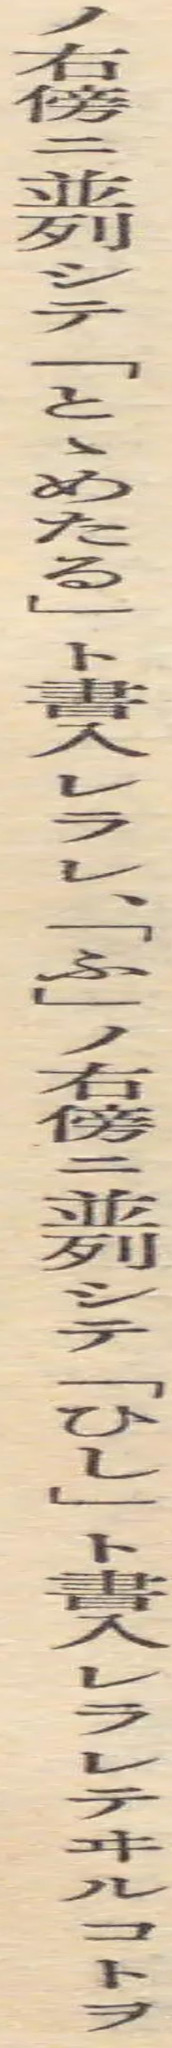ノ右傍ニ並列シテ「とゝめたる」ト書入レラレ、「ふ」ノ右傍ニ並列シテ「ひし」ト書入レラレテヰルコトヲ
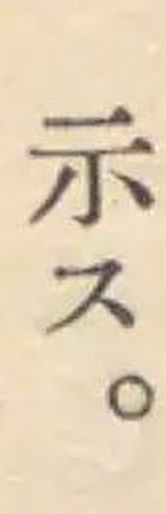示ス。
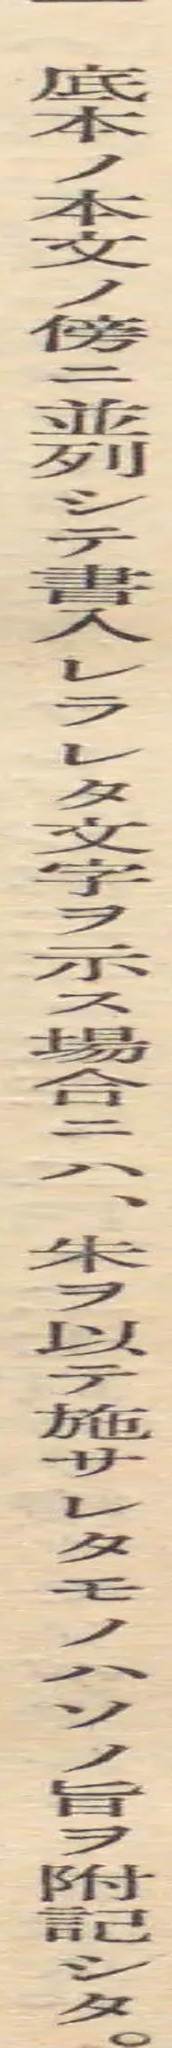一底本ノ本文ノ傍ニ並列シテ書入レラレタ文字ヲ示ス場合ニハ、朱ヲ以テ施サレタモノハソノ旨ヲ附記シタ。
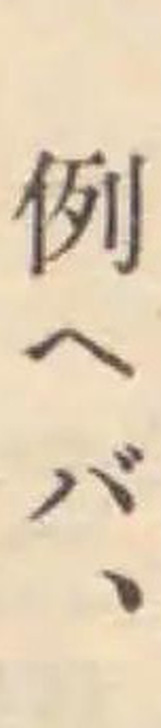例ヘバ、
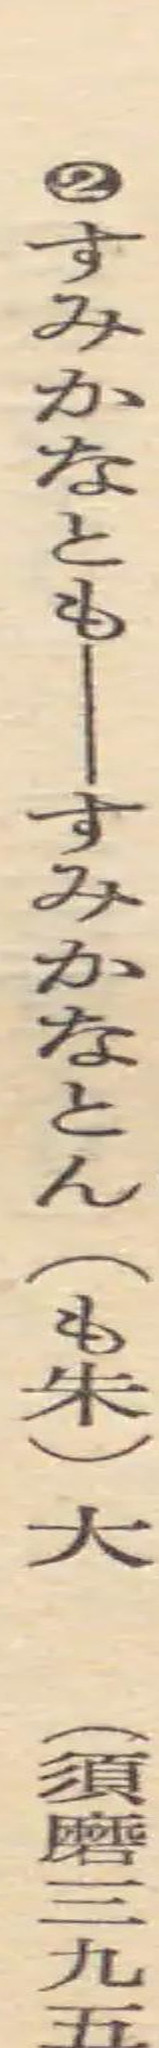➋すみかなとも──すみかなとん(も朱)大(須磨三九五頁)
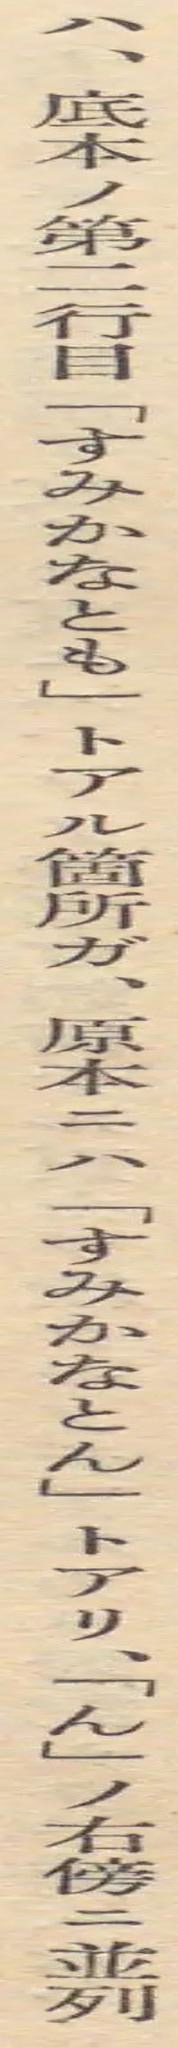ハ、底本ノ第二行目「すみかなとも」トアル箇所ガ、原本ニハ「すみかなとん」トアリ、「ん」ノ右傍ニ並列
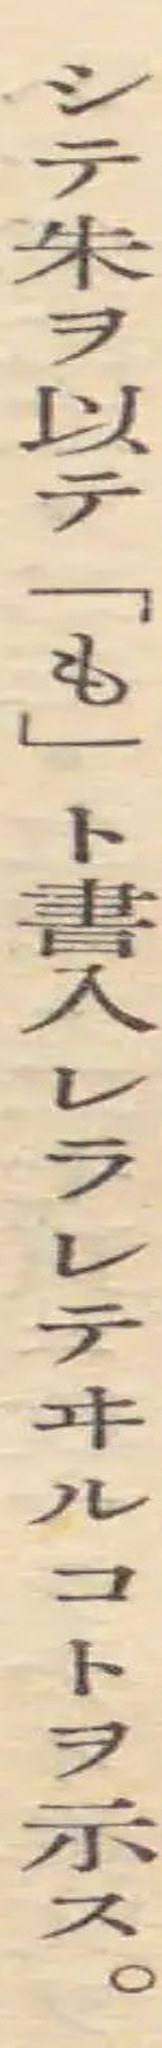シテ朱ヲ以テ「も」ト書入レラレテヰルコトヲ示ス。
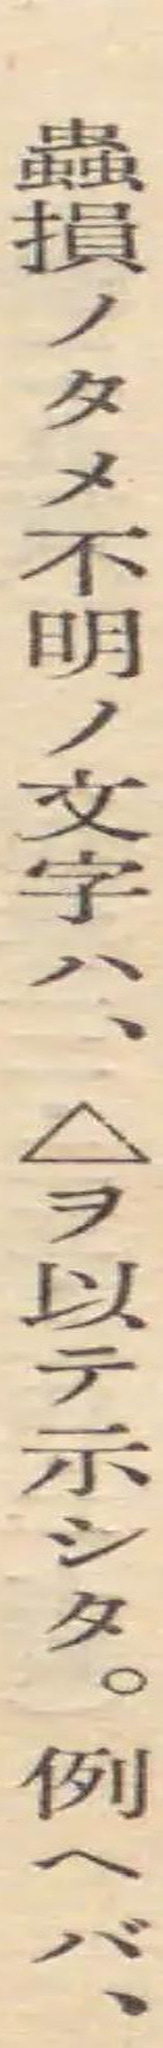一虫損ノタメ不明ノ文字ハ、△ヲ以テ示シタ。例ヘバ、
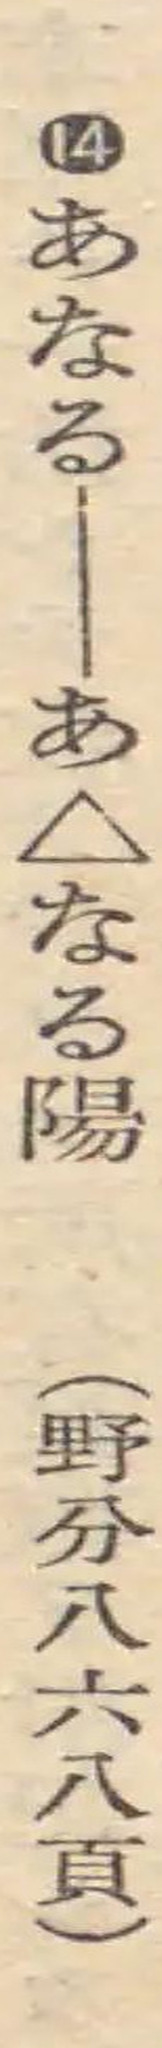⓮あなる──あ△なる陽(野分八六八頁)
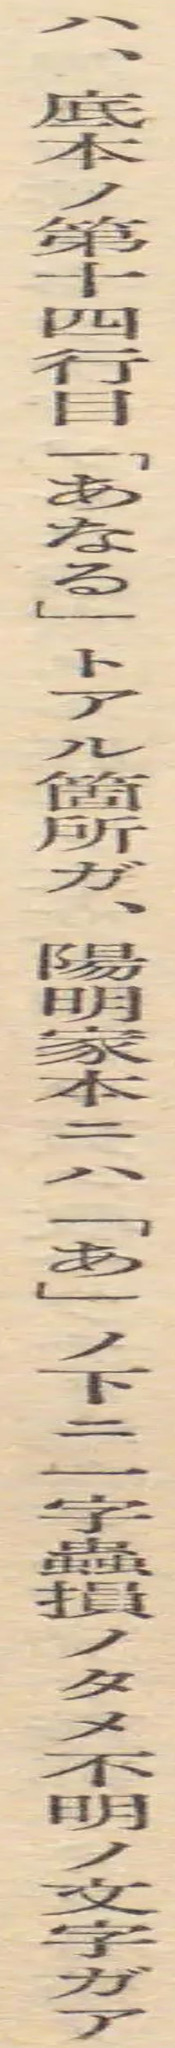ハ、底本ノ第十四行目「あなる」トアル箇所ガ、陽明家本ニハ「あ」ノ下ニ一字虫損ノタメ不明ノ文字ガア
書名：校異源氏物語.
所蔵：国立国会図書館 National Diet Library, JAPAN
